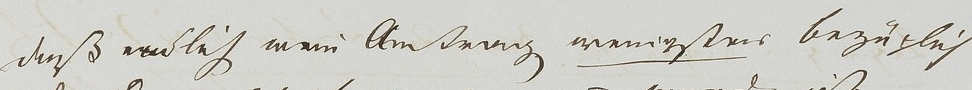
daß endlich mein Antrag wenigstens bezüglich
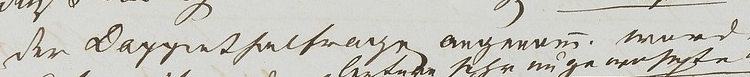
der Dappenthalfrage angenommen worden
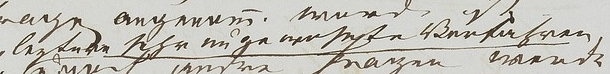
dieses leztere sehr ungewohnte Verfahren
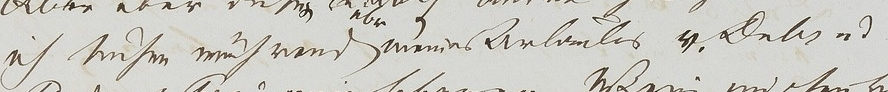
ich suchen während meines Urlaubs v. Dubs u.
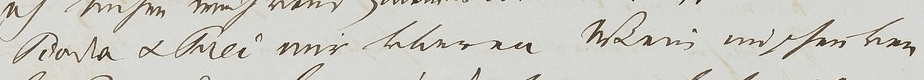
Pioda & Frei mir klaren Wein einschenken
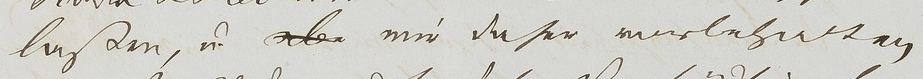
laßen, u. mir daher vorbehalten,
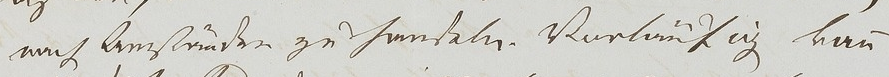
nach Umständen zu handeln. Vorläufig kann
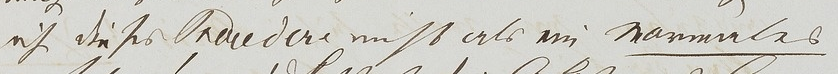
ich dieses Procedere nicht als ein normales
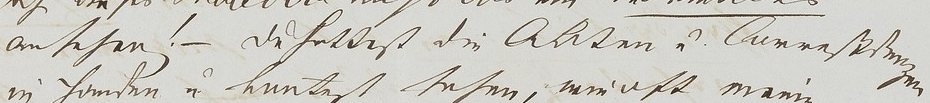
ansehen! – Du hattest die Akten u. Correspondenzen
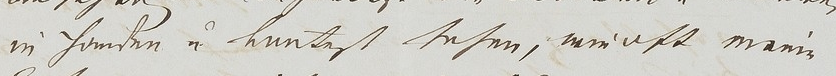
in Handen u. konntest sehen, wie oft meine
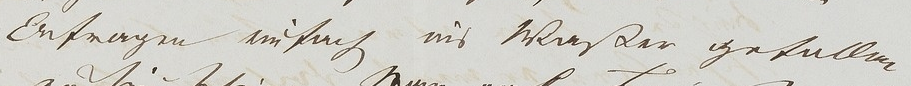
Anfragen einfach ins Wasser gefallen
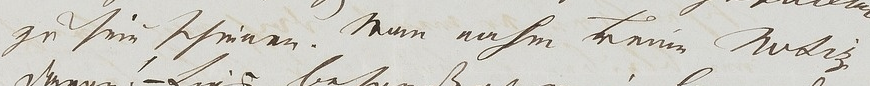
zu sein scheinen. Man nahm kaum Notiz
